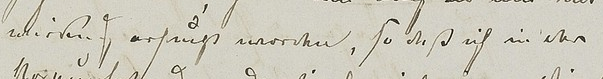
wirkung ersucht worden, so daß ich in der
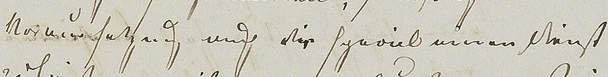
Voraussetzung auch dir speciel einen Dienst
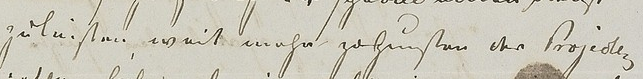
zu leisten, weit mehr zu Gunsten des Projectes
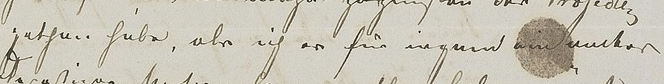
gethan habe, als ich es für irgend ein anders
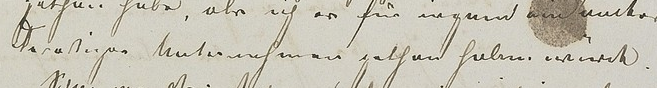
derartiges Unternehmen gethan haben würde.
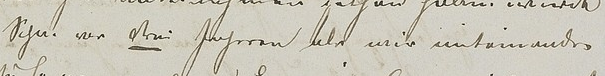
Schon vor drei Jahren als wir miteinander
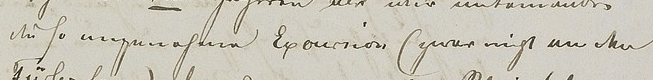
die so angenehme Excursion (zwar nicht an den
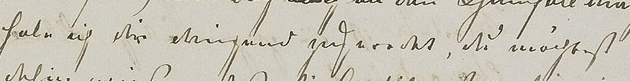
habe ich dir dringend zugeredet, du möchtest
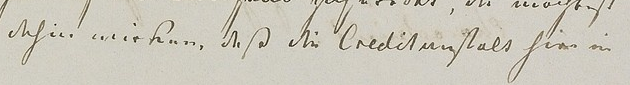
dahin wirken, daß die Creditanstalt hier in
